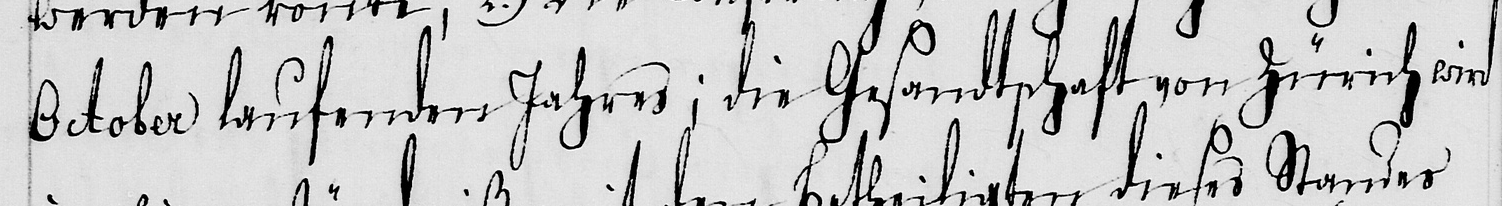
October laufenden Jahres; die Gesandtschaft von Zürich
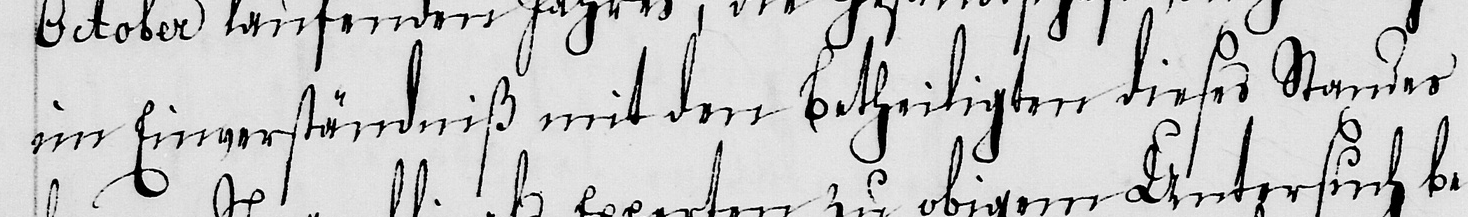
im Einverständniß mit den Betheiligten dieses Standes
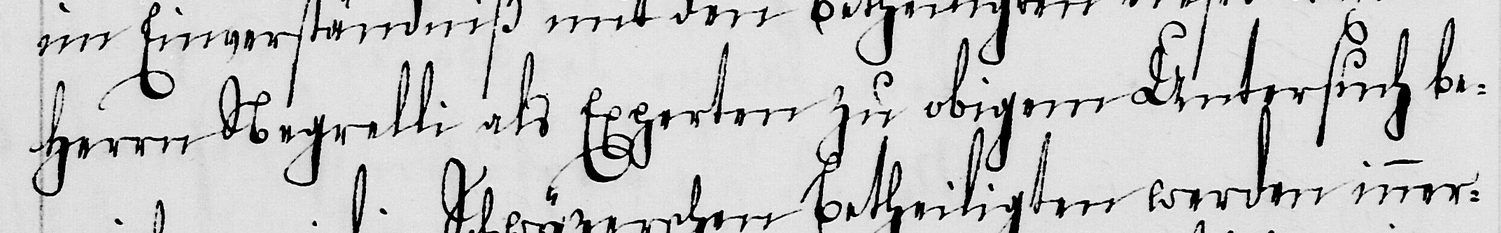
Herrn Negrelli als Experten zu obigem Untersuch be¬
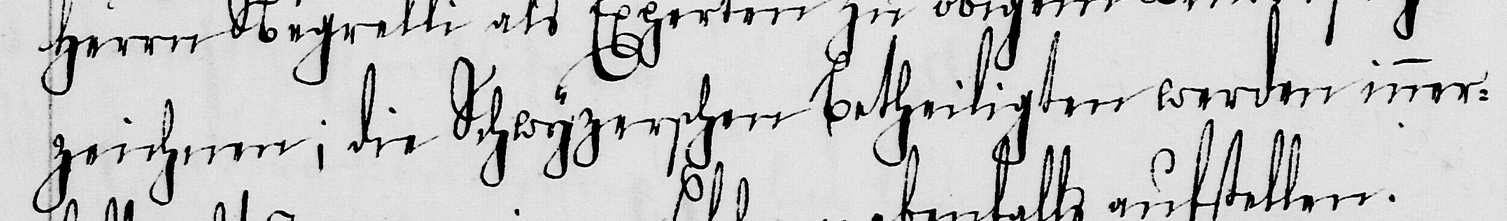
zeichnen; die Schwyzerschen Betheiligten werden inner¬
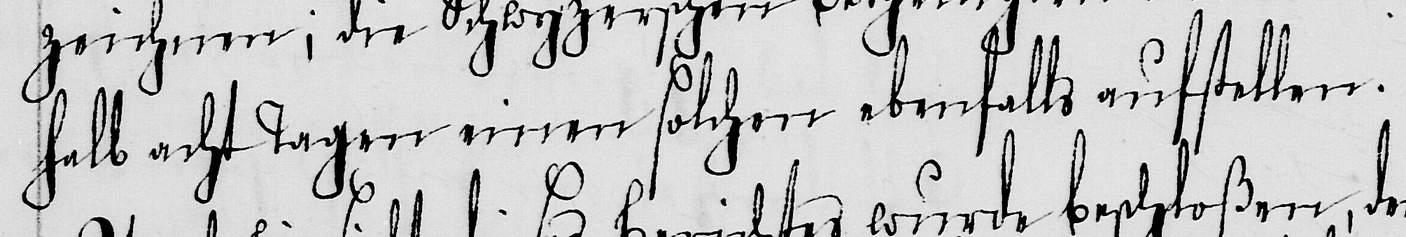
halb acht Tagen einen solchen ebenfalls aufstellen.
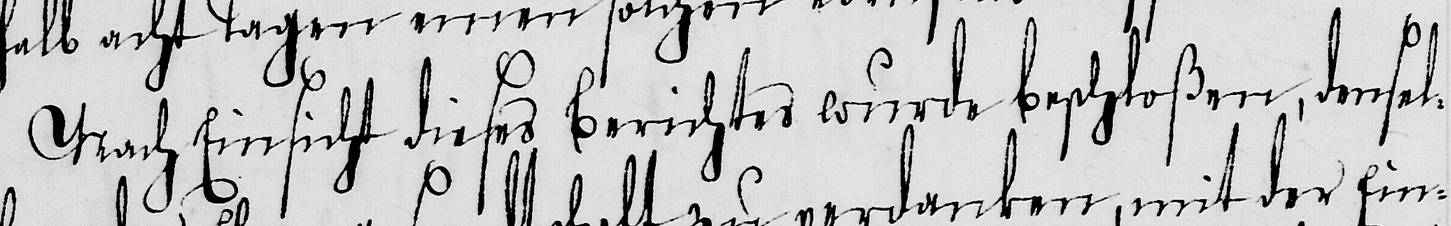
Nach Einsicht dieses Berichtes wurde beschloßen, dense¬
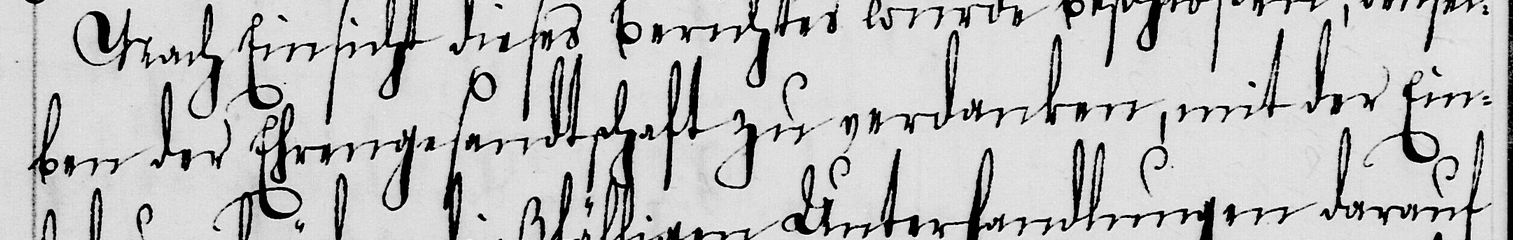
lben der Ehrengesandtschaft zu verdanken, mit der Ein¬
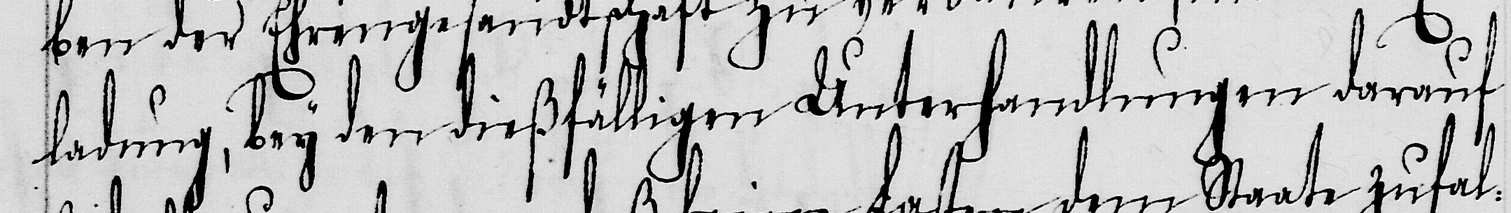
ladung, bey den dießfälligen Unterhandlungen darauf
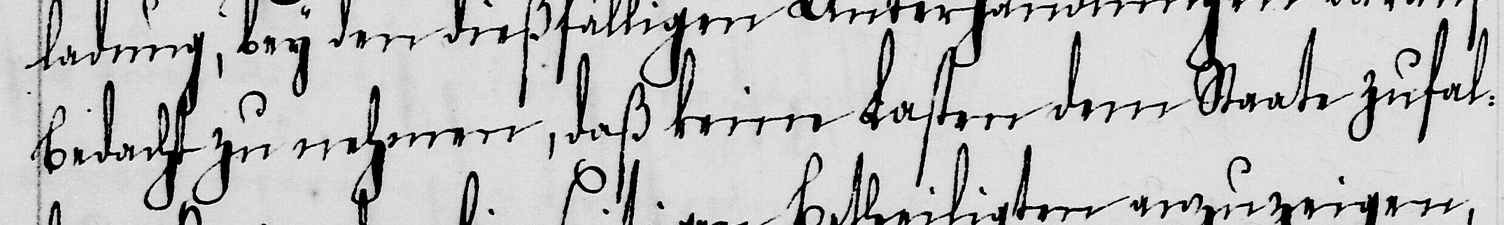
Bedacht zu nehmen, daß keine Lasten dem Staate zufal¬
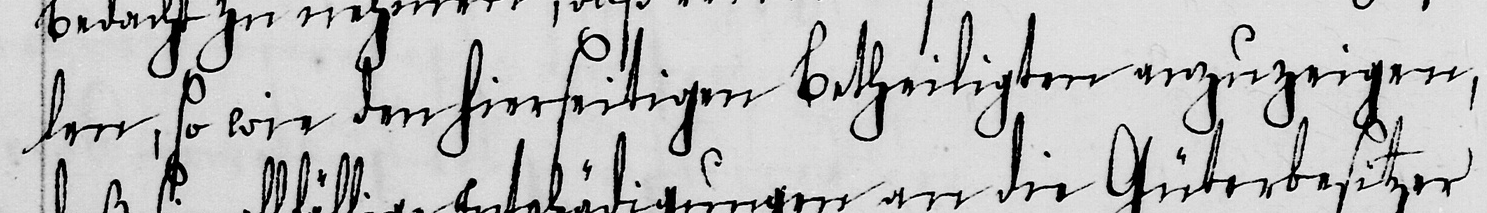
len, so wie den hierseitigen Betheiligten anzuzeigen,
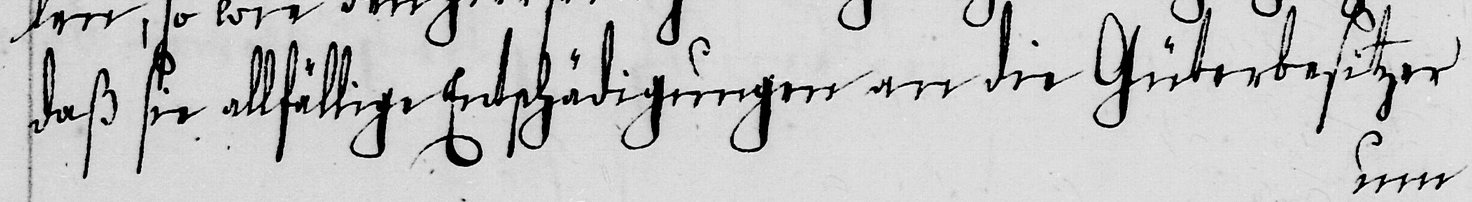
daß sie allfällige Entschädigungen an die Güterbesitzer
